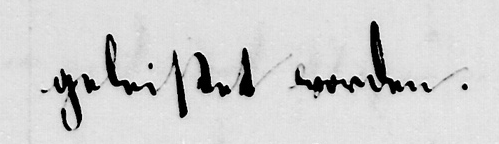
geleistet worden.
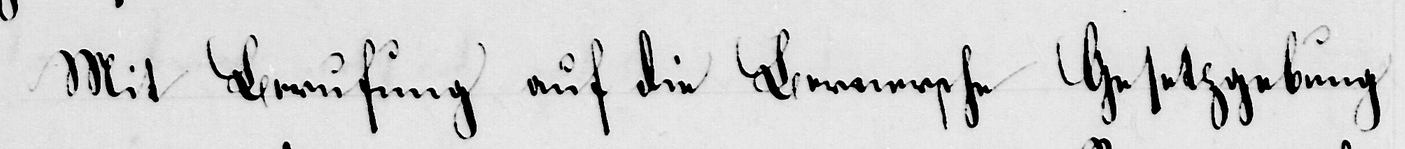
Mit Berufung auf die Bernersche Gesetzgebung
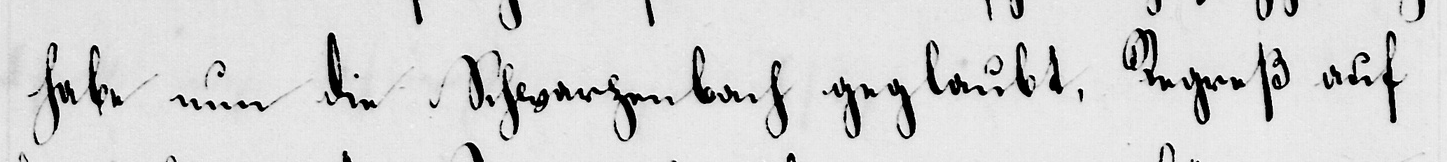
habe nun die Schwarzenbach geglaubt, Regreß auf
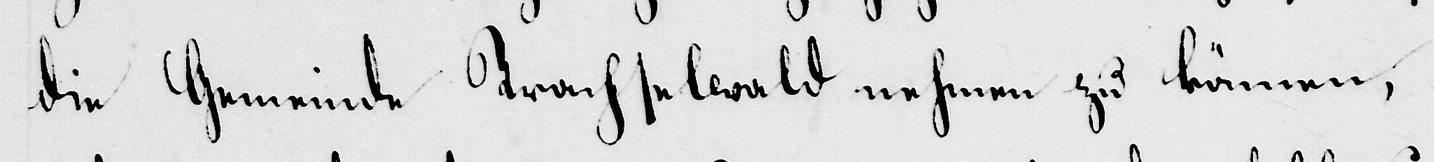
die Gemeinde Trachselwald nehmen zu können,
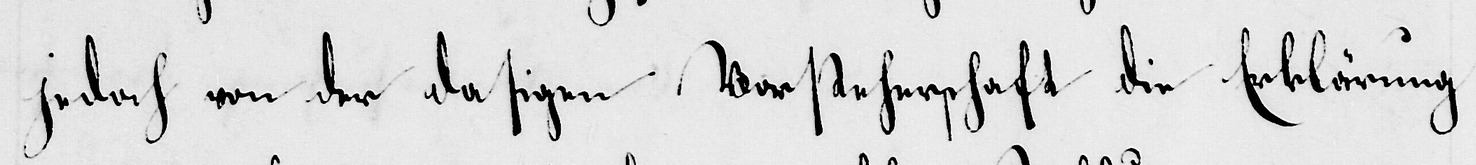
jedoch von der dasigen Vorsteherschaft die Erklärung
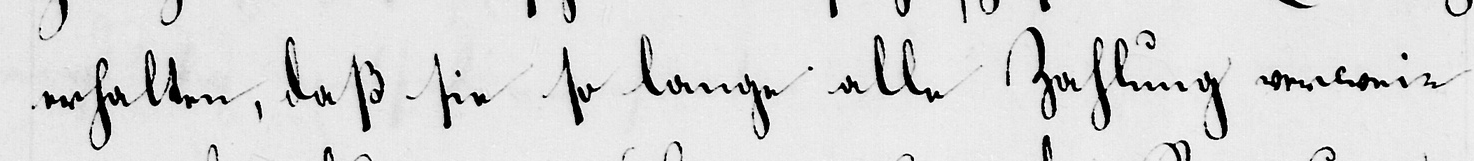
erhalten, daß sie so lange alle Zahlung verwei¬
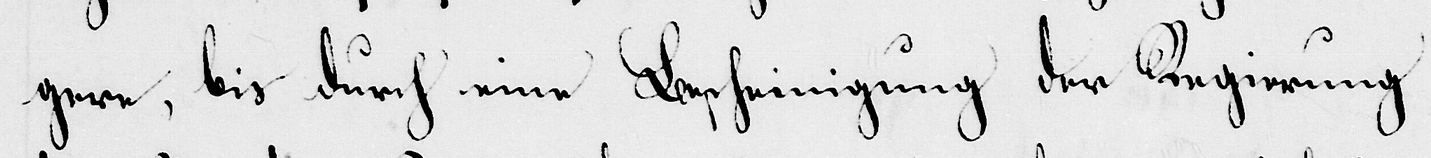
gern, bis durch eine Bescheinigung der Regierung
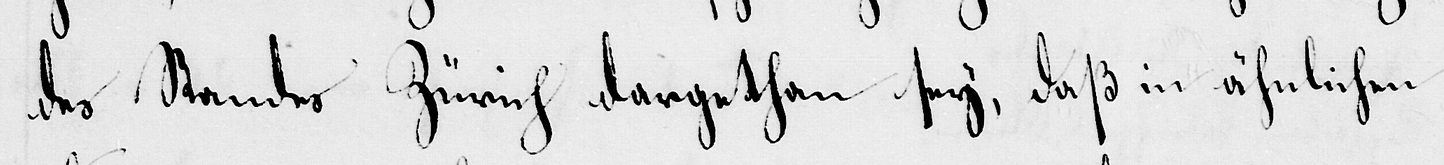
des Standes Zürich dargethan sey, daß in ähnlichen
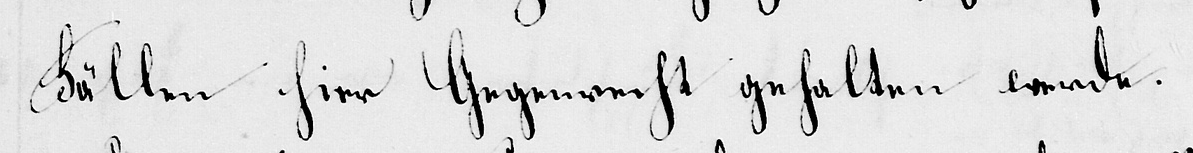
Fällen hier Gegenrecht gehalten werde.
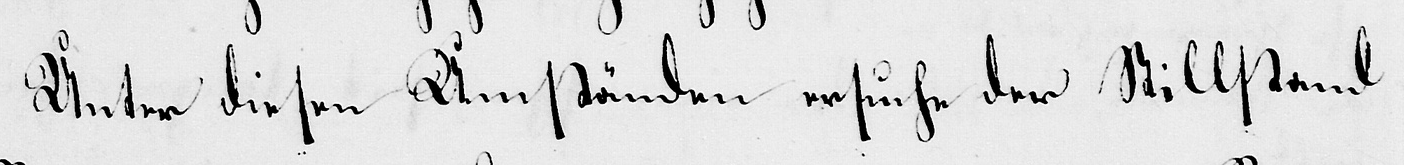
Unter diesen Umständen ersuche der Stillstand
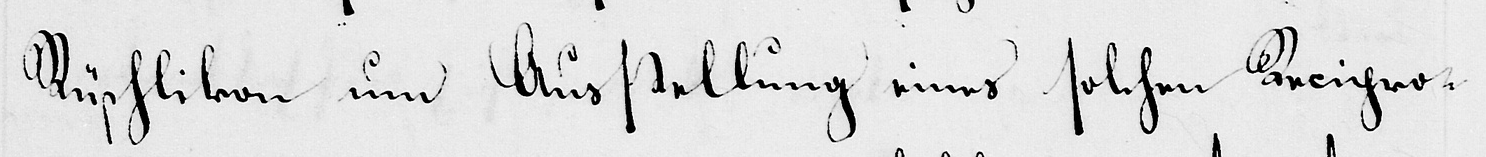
Rüschlikon um Ausstellung eines solchen Recipro¬
